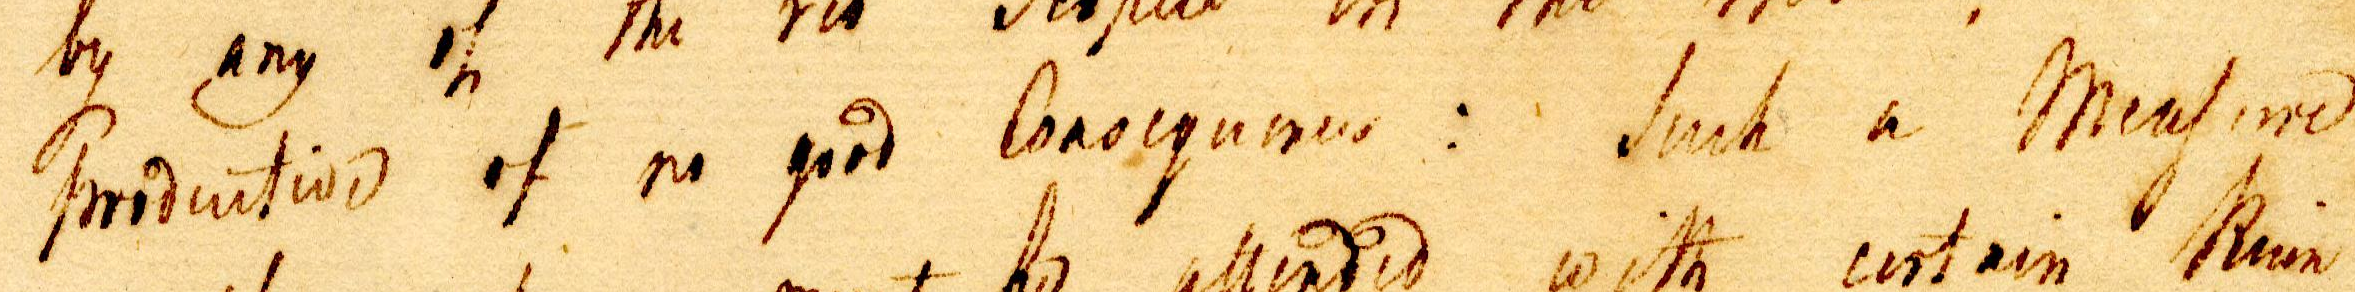productive of no good Consequences: Such a Measure
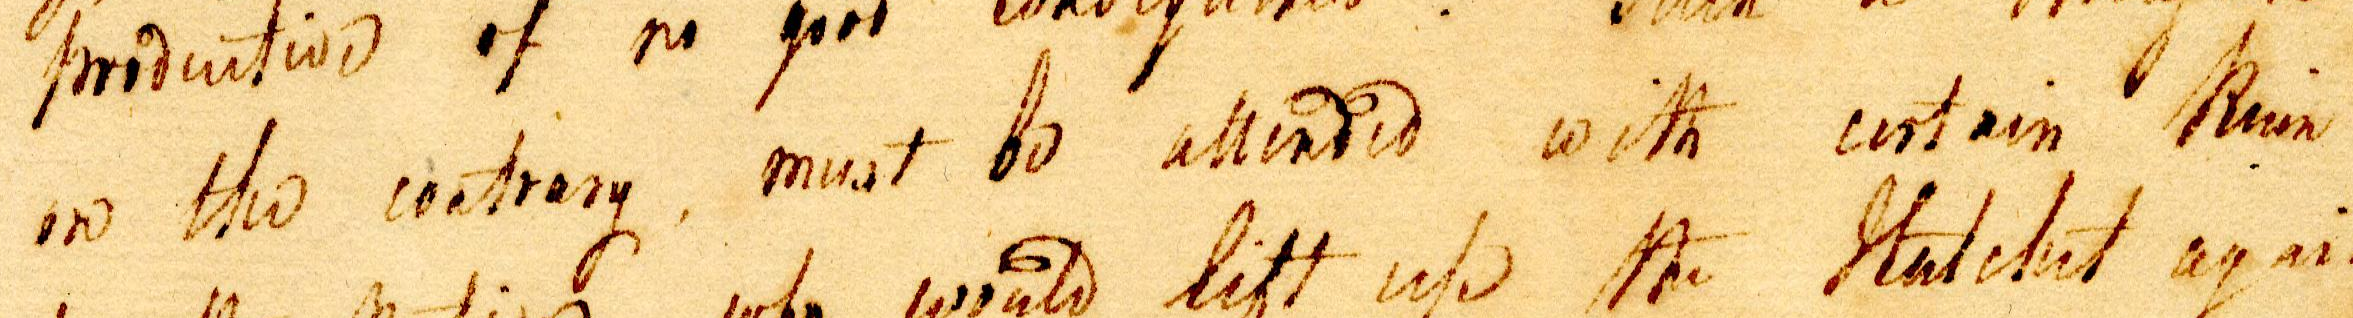on the contrary, must be attended with certain Ruin
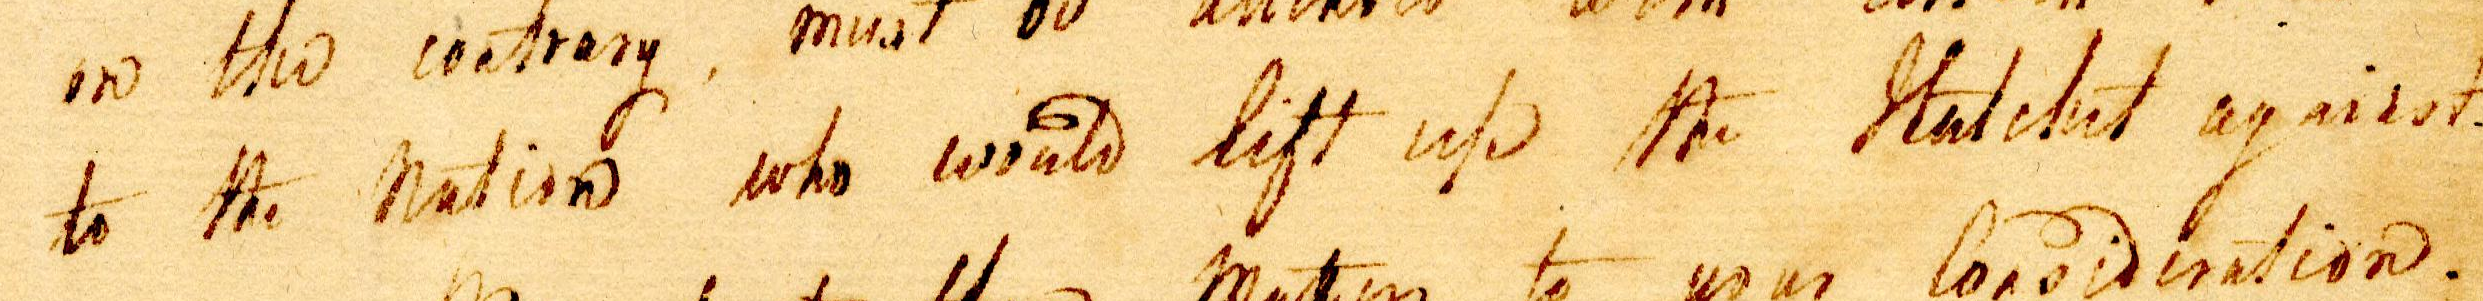to the Nation who would lift up the Hatchet against
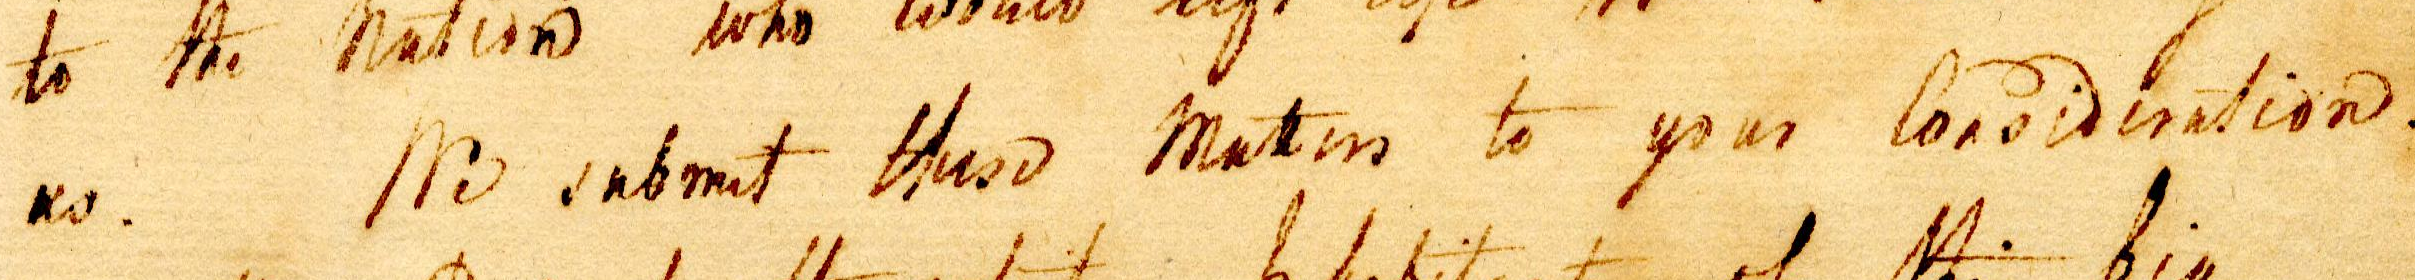us. We submit these Matters to your Consideration.
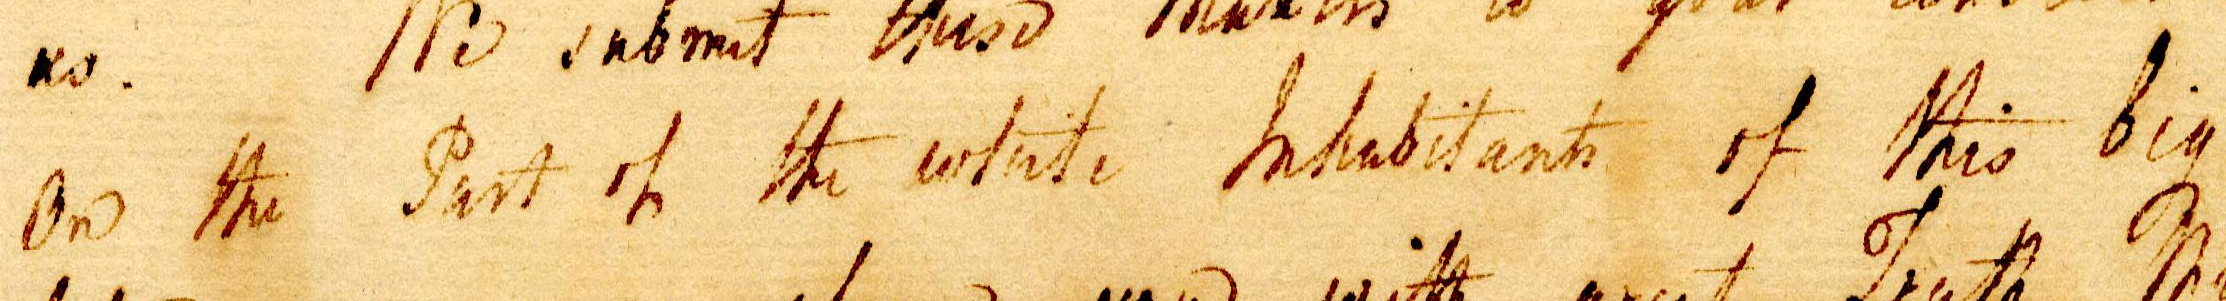On the Part of the white Inhabitants of this big
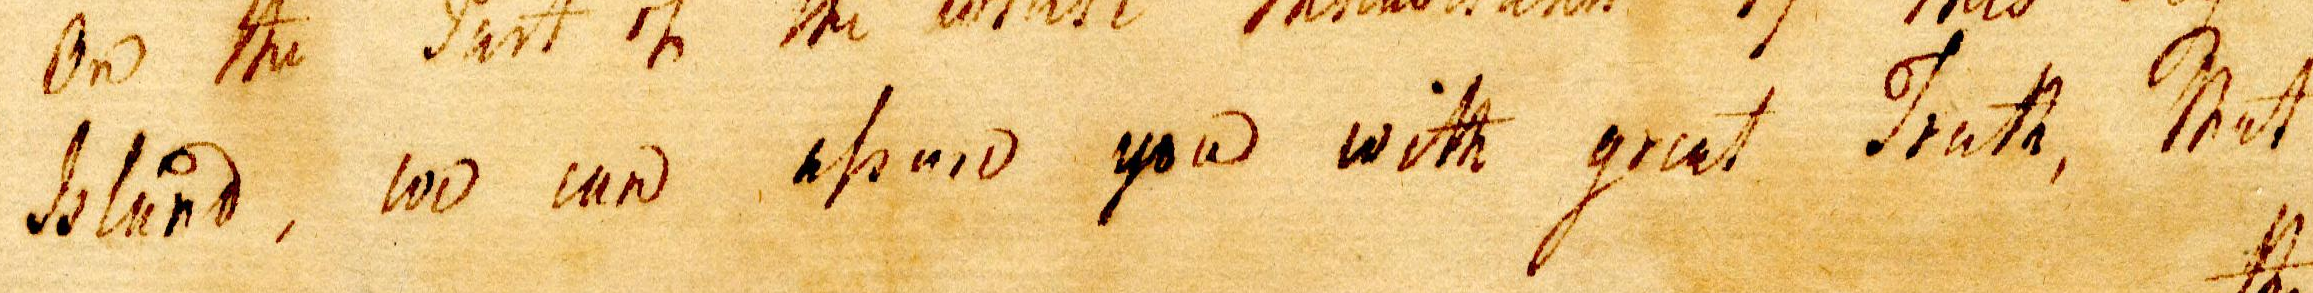Island, we can assure you with great Truth, that
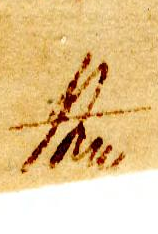there
